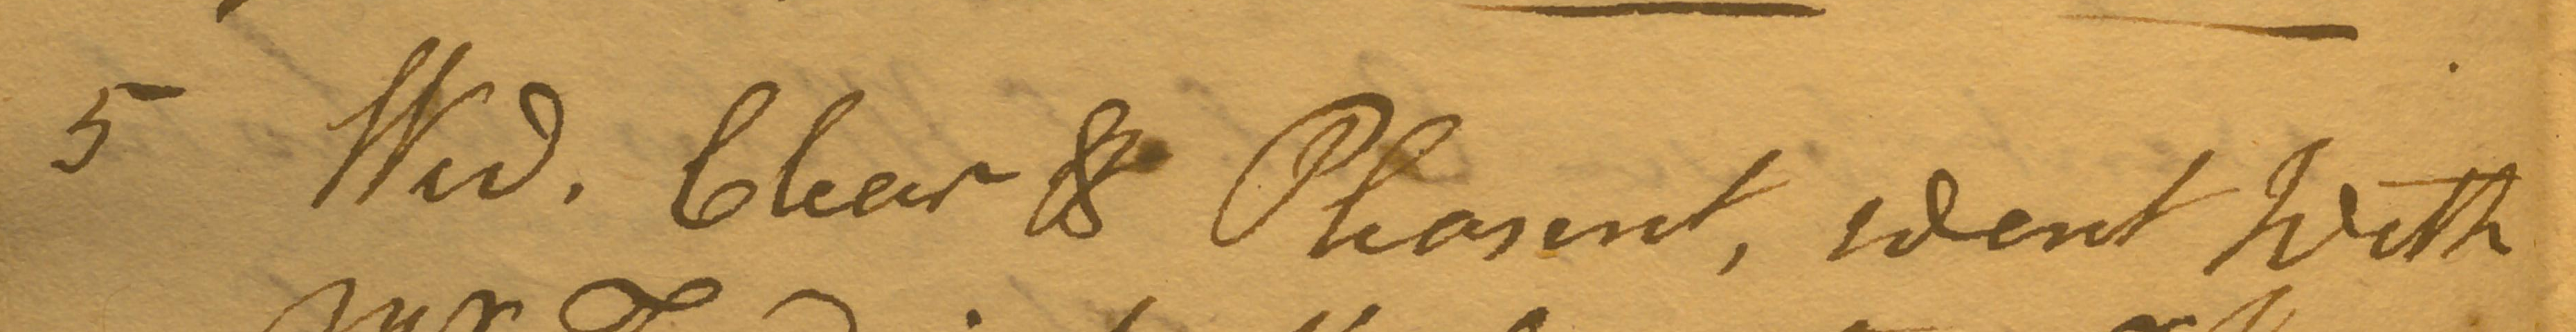5 Wed. Clear & Pleasent, went with
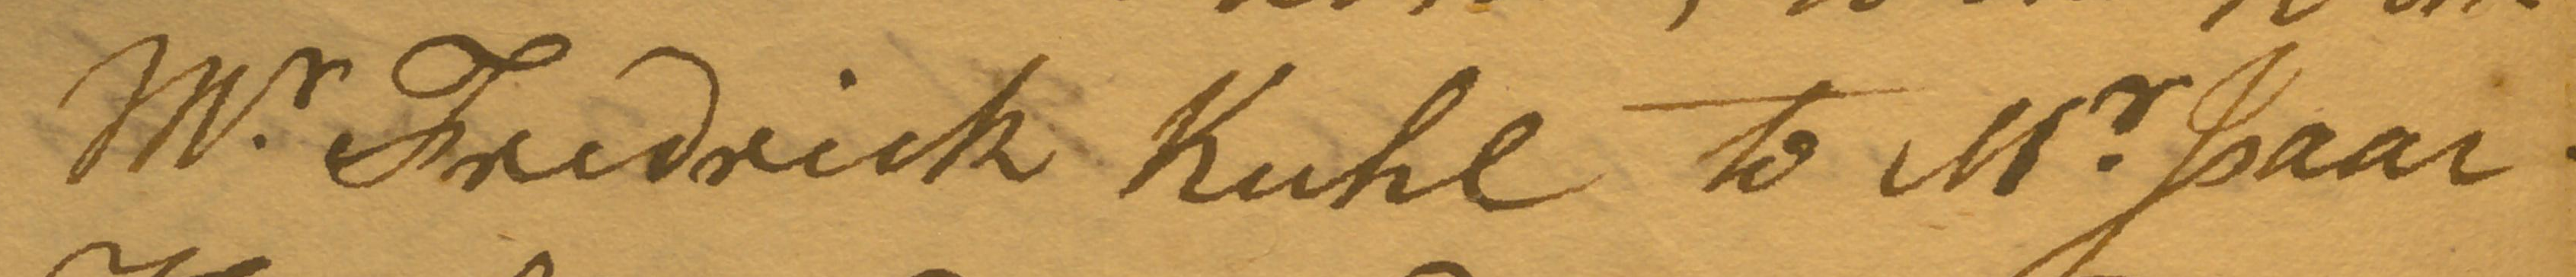M^r. Fredrick Kuhl to M^r. Isaac
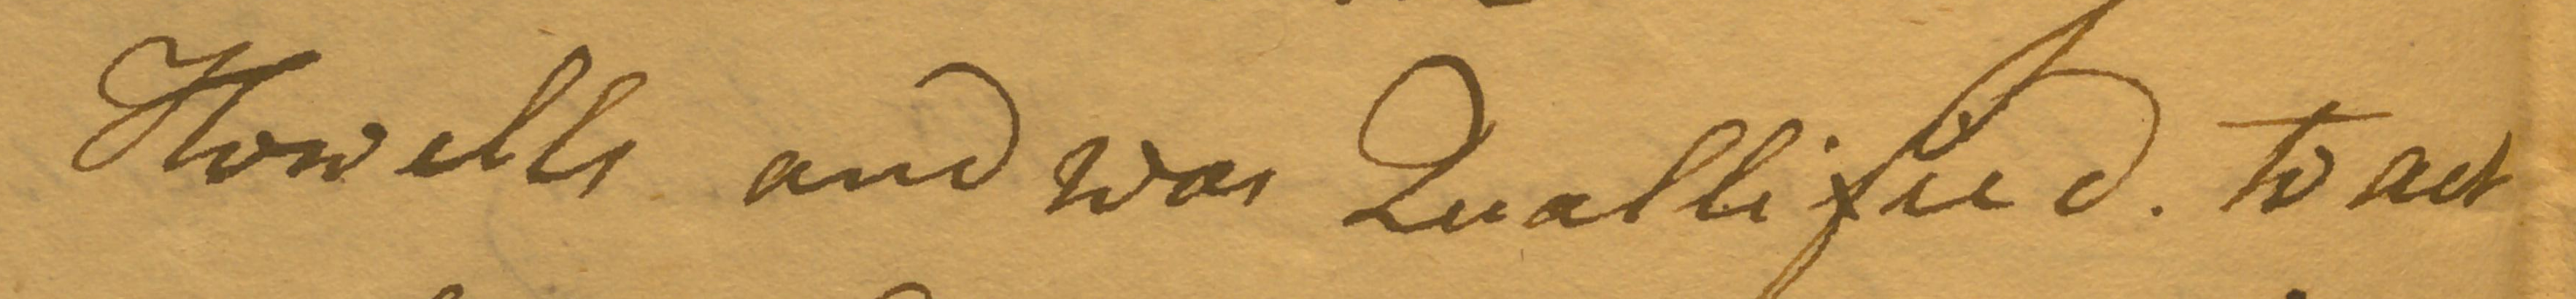Howells and was Quallified. to act
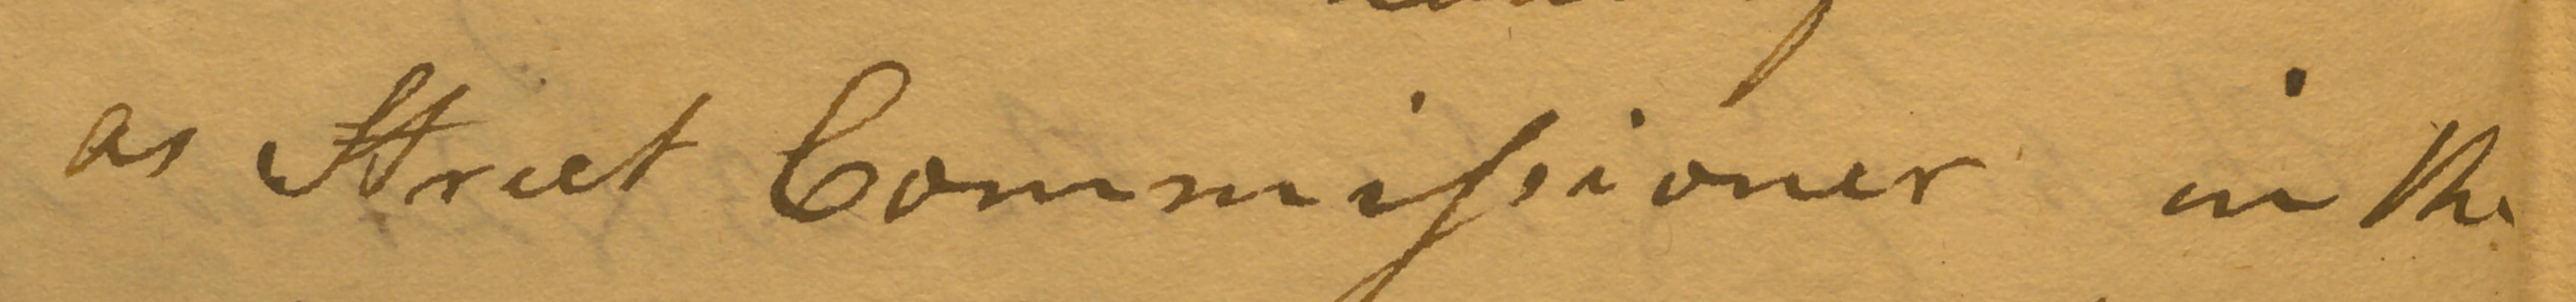as Street Commissioner in the
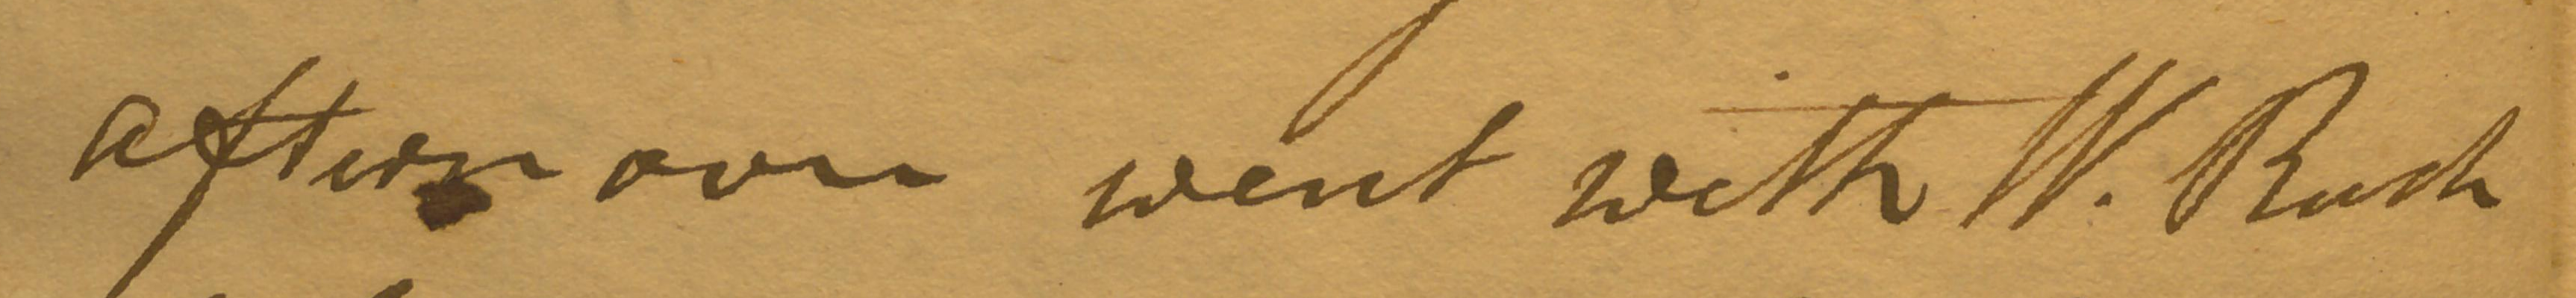afternoon went with W. Rush
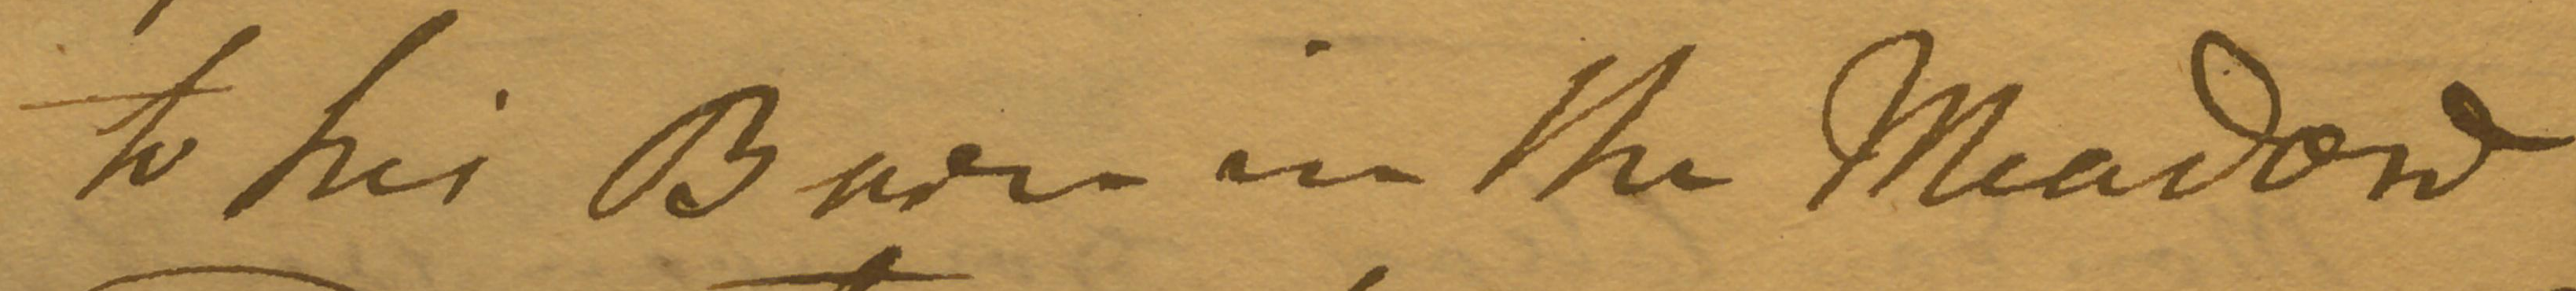to his Barn in the Meadow
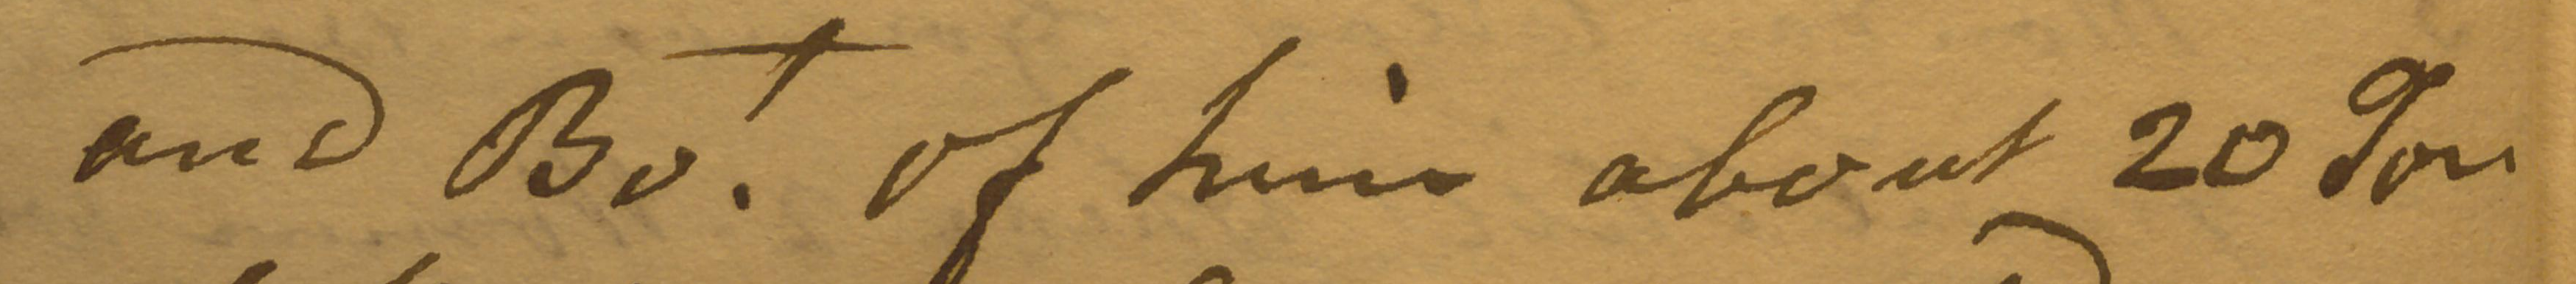and Bo^r. of hie about 20 Ton
